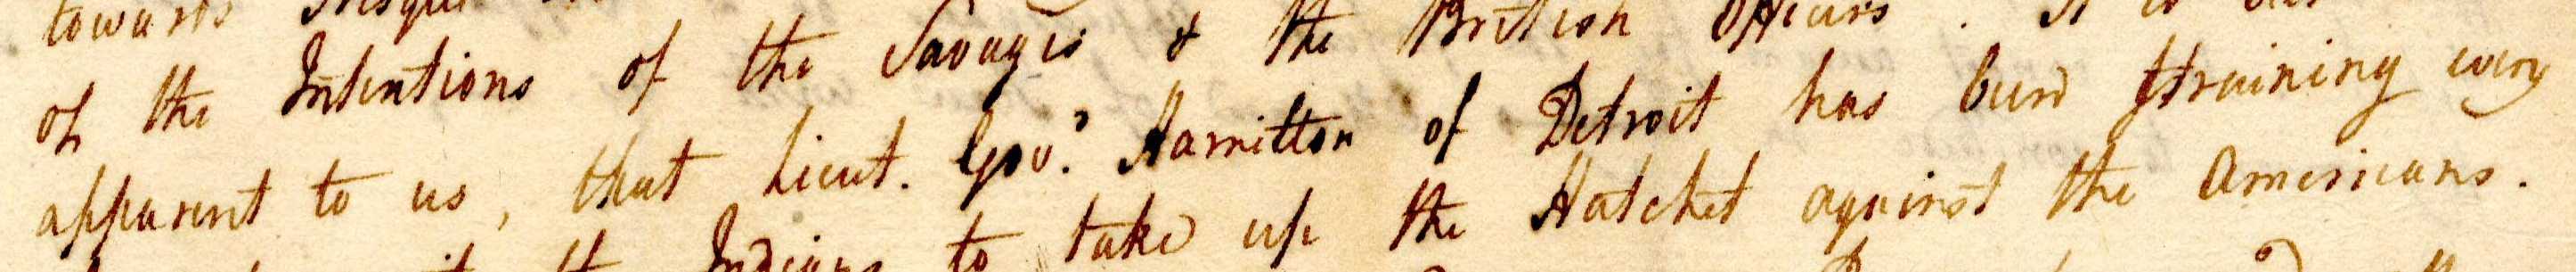apparent to us, that Lieut. Gov^r. Hamilton of Detroit has been Straining every
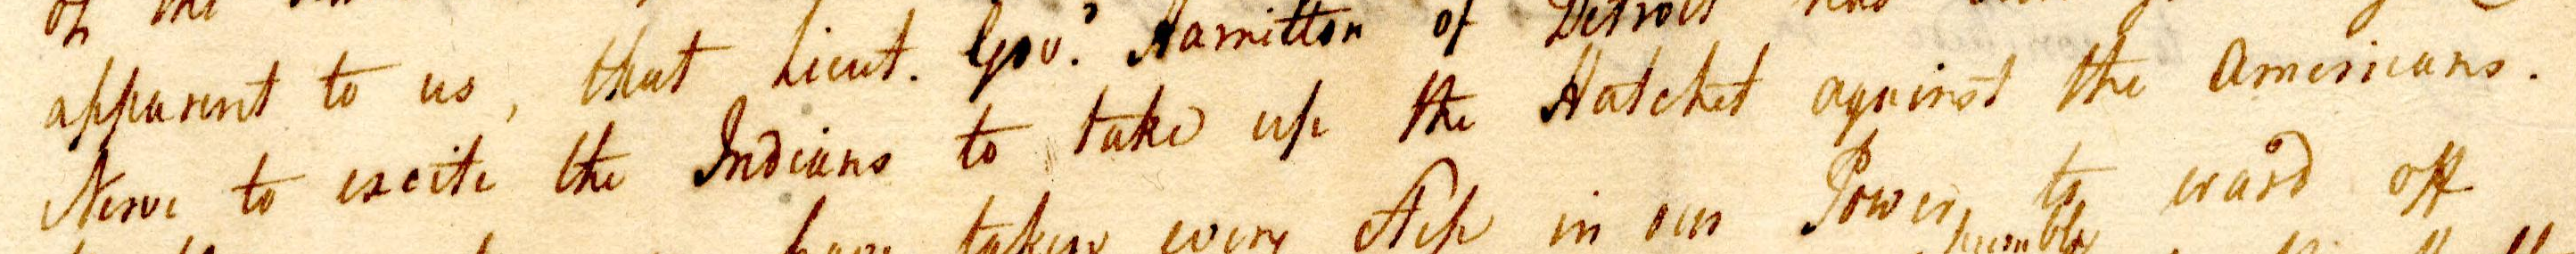Nerve to excite the Indians to take up the Hatchet against the Americans.
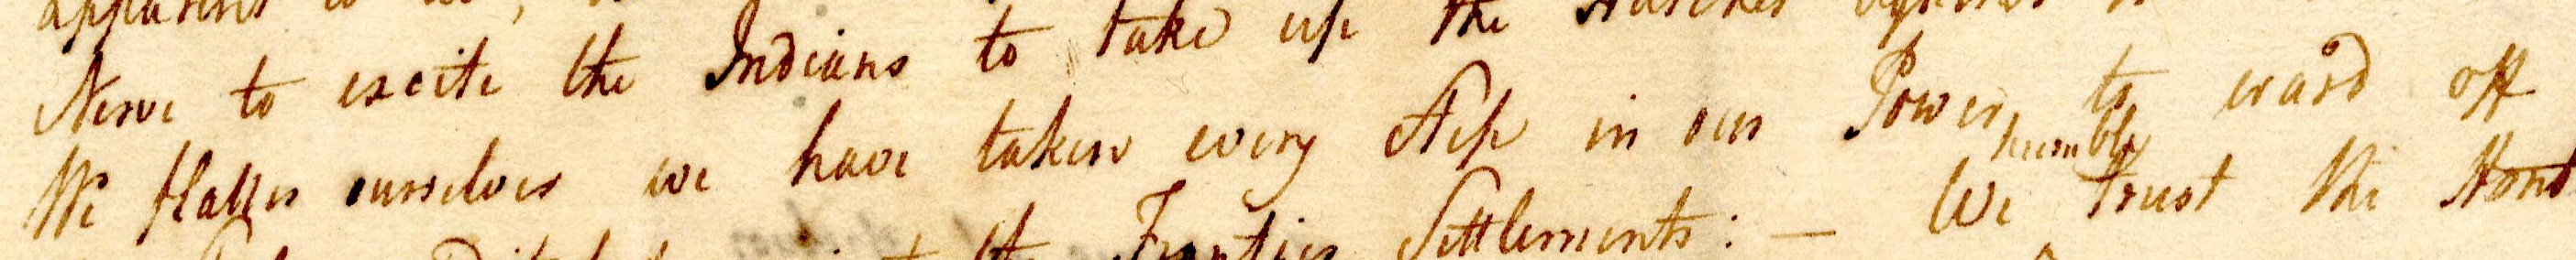We flatter ourselves we have taken every Step in our Power to ward off
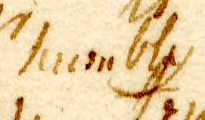humbly
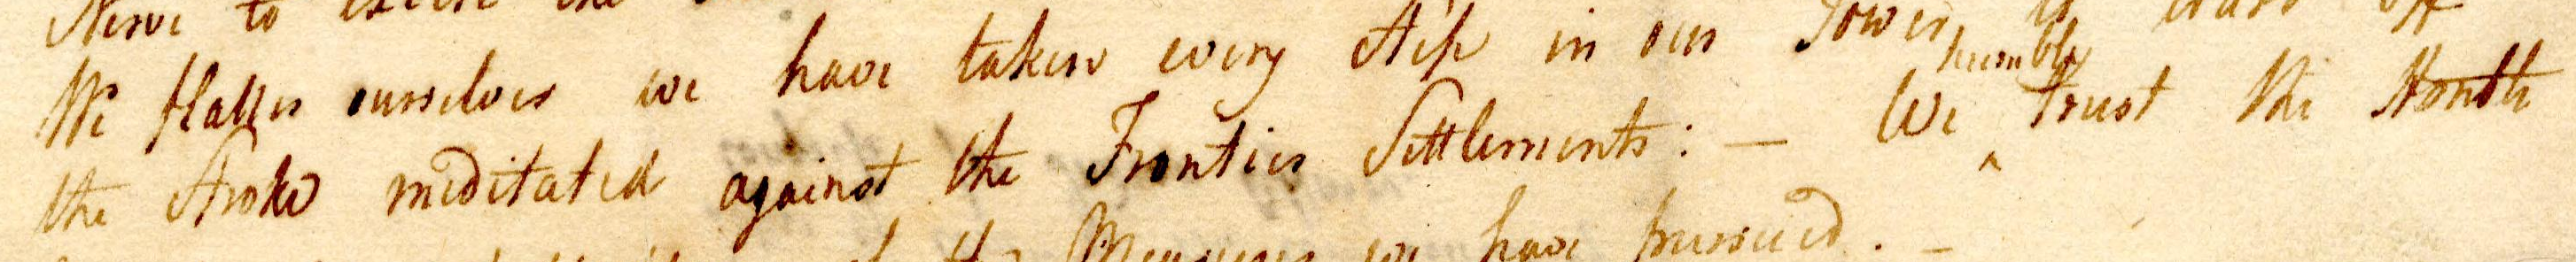the Stroke meditated against the Frontier Settlements:- We ^ trust the Ninth
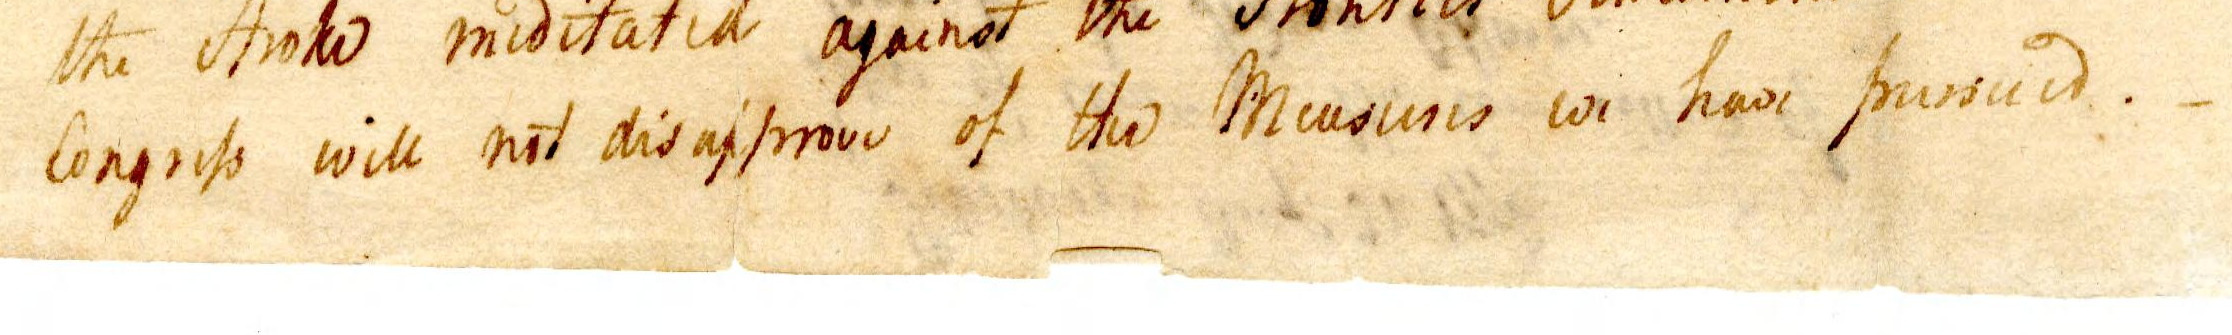Congress will not disapprove of the Measures we have pursued.-
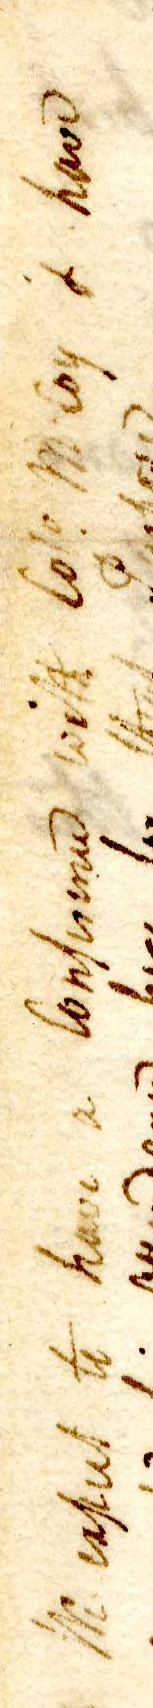We expect to have a Conference with Col^o McCoy & have
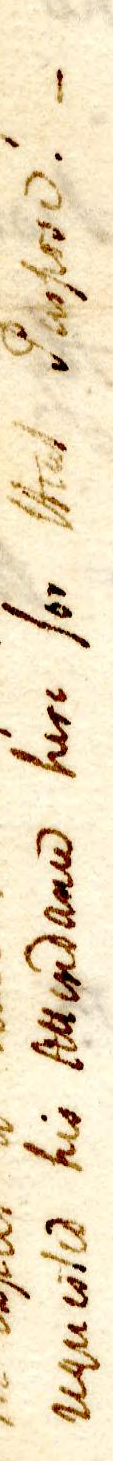requested his Attendance here for that Purpose.
